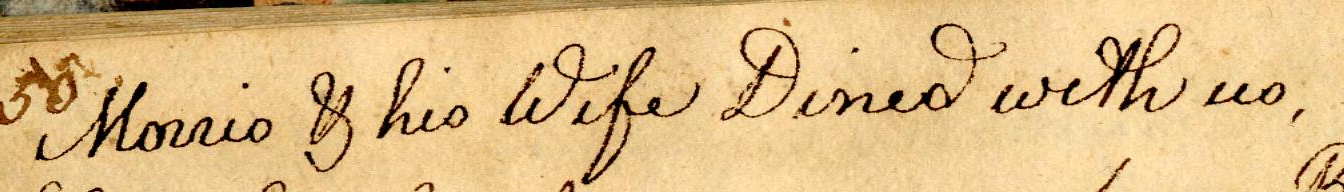Morris & his Wife Dined with us,
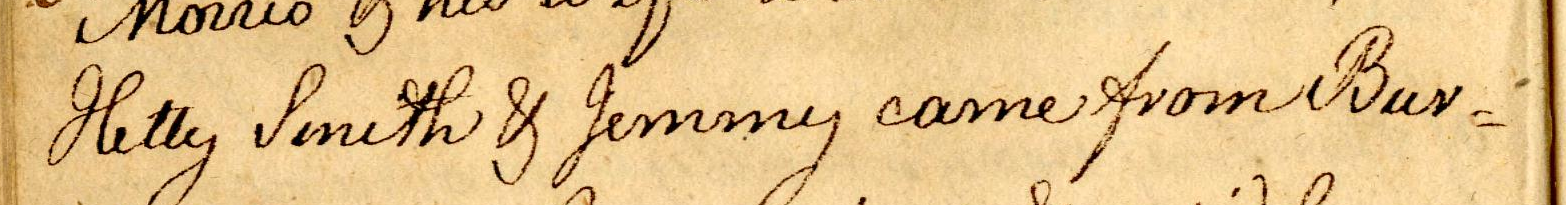Hetty Smith & Jemmy came from Bur-
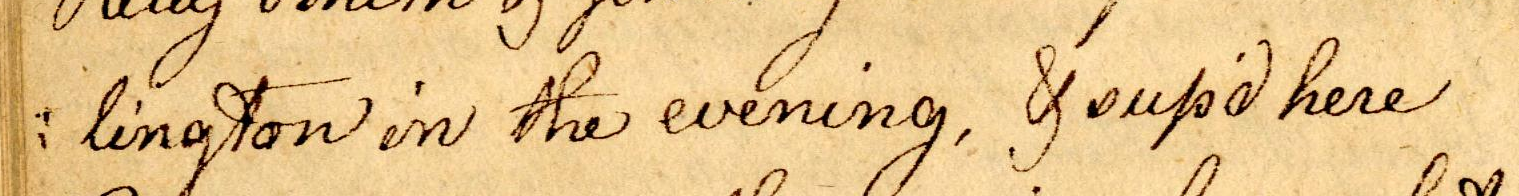-lington in the evening, & sup'd here
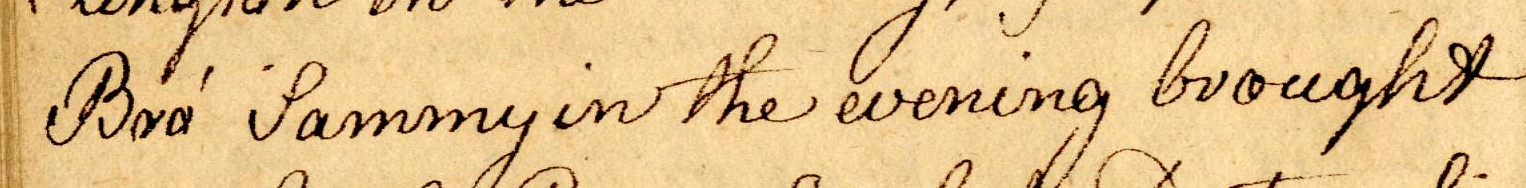Bro' Sammy in the evening brought
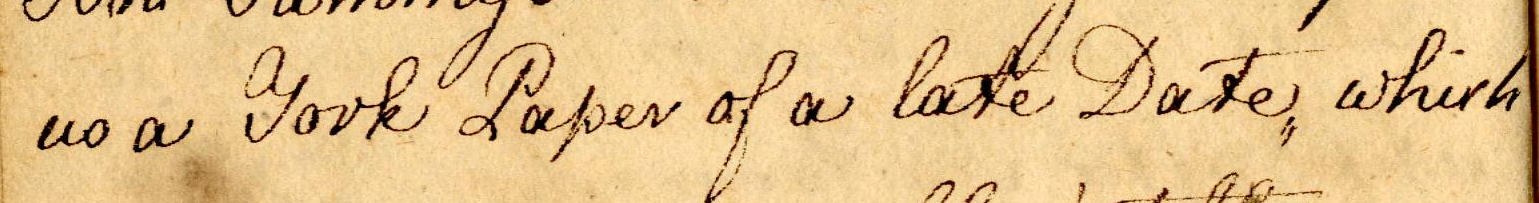us a York Paper of a late Date, which
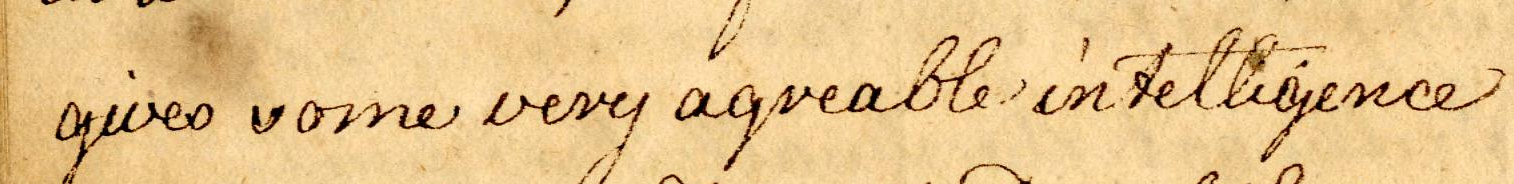gives some very agreable intelligence
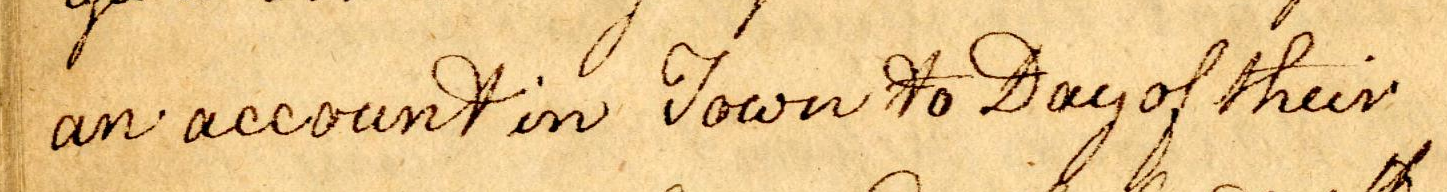an account in Town to Day of their
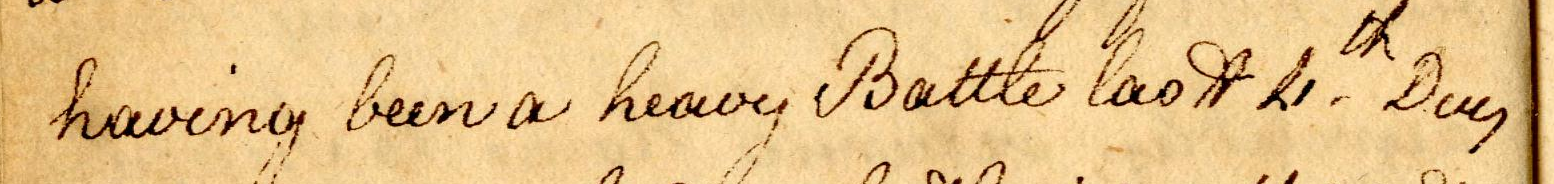having been a heavy Battle last 4^th. Day
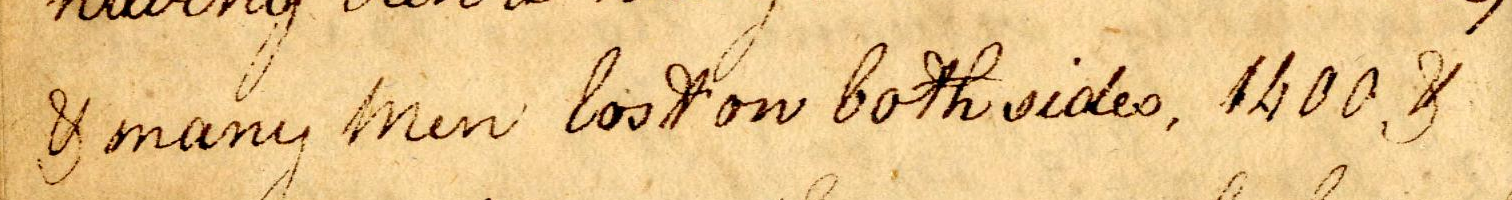& many Men lost on both sides, 1400 &
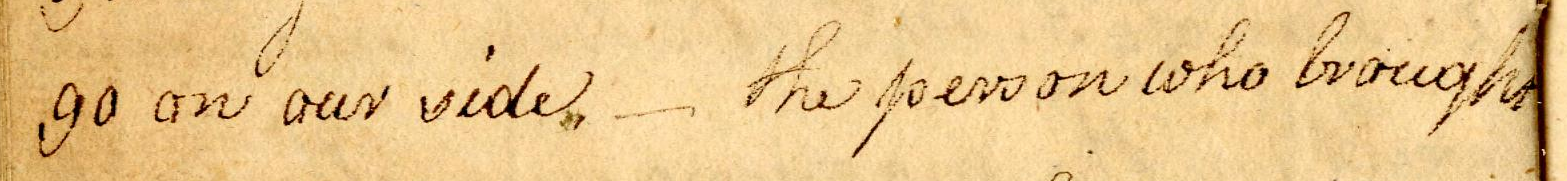90 on our side- the person who brought
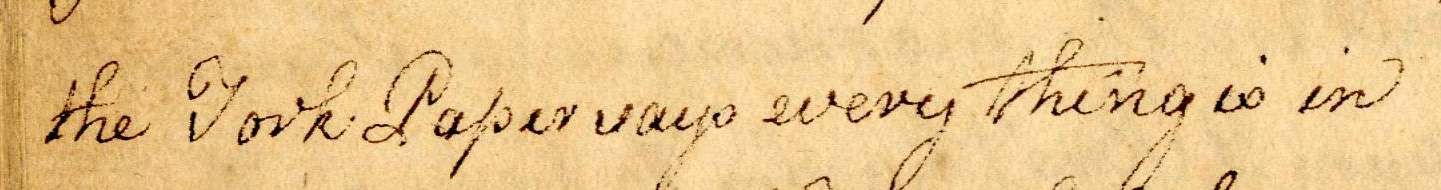the York Paper says every thing is in
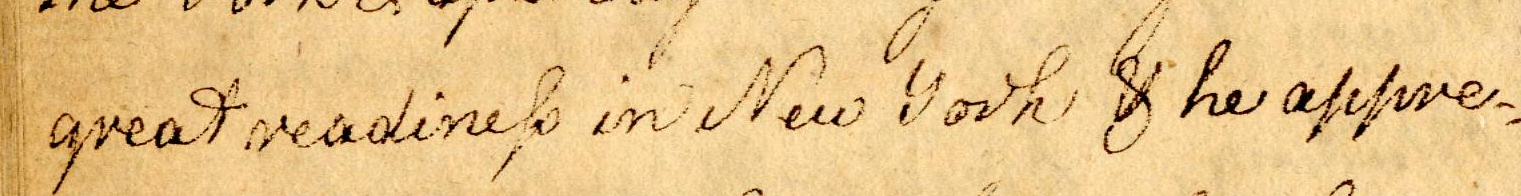great readiness in New York & he appre-
